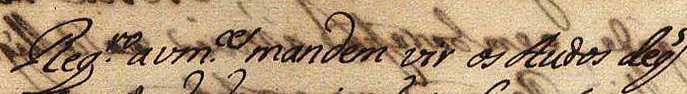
Req.ro a vm.ces mandem vir os Autos de q̄
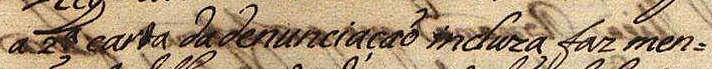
a 2a carta da denunciaçaõ incluza faz men
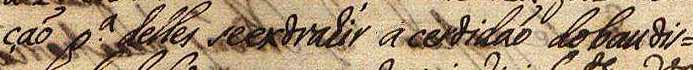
ção p.a delles se extrahir a certidaõ do bautis
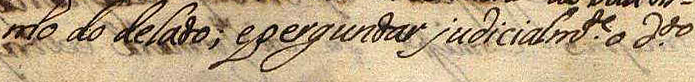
mo do delato; e perguntar judicialm.te o d.to
